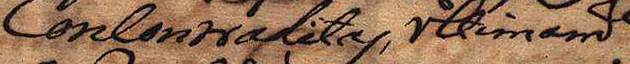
Con contraditas, vltimamte
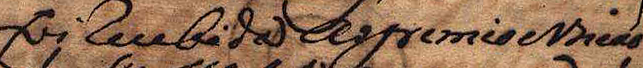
foi Recebida ao gremio e vnião
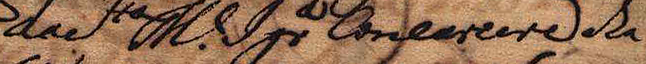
da Sta M.e Igra con carcere e ha
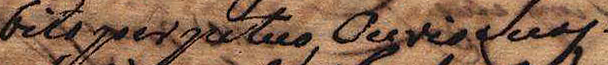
bito perpetuo, Ouvio suas
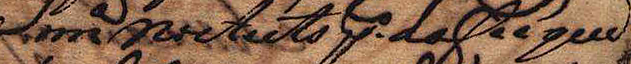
snn.a no Auto p.co da feé que
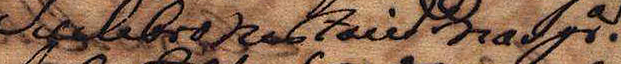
se celebro nesta cide na Igra.
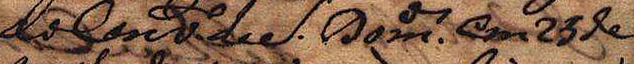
do Conv.to de S. Domos. em 23 de
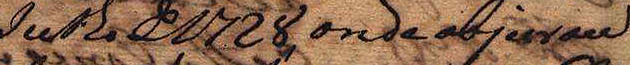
Iulho d̄ 1728, onde abjurou
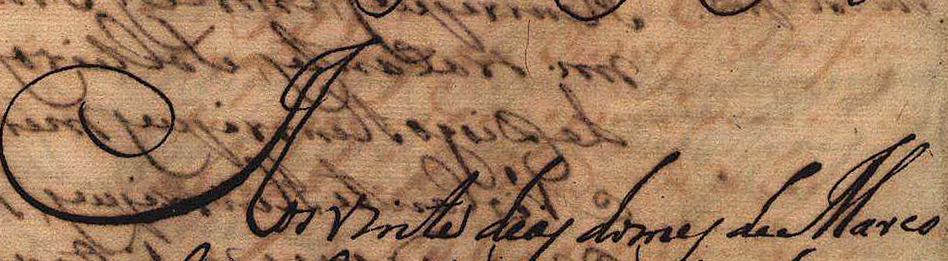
Aos vinte dias do mes de Marco
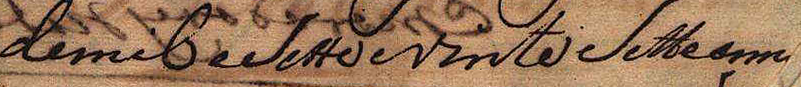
de mil e sette e vinte sette ann
